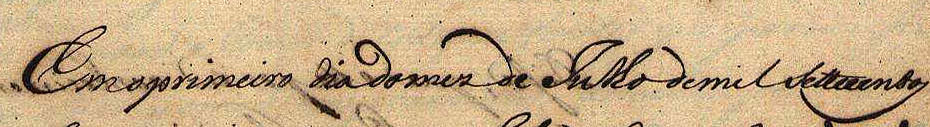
Em o primeiro dia do mez de Iulho de mil Settecentos
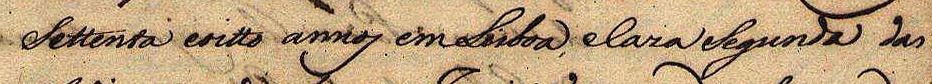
Settenta e oitto annos em Lisboa, e Caza Segunda das
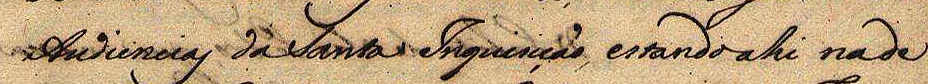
Audiencias da Santa Inquisiçaõ, estando ahi na de
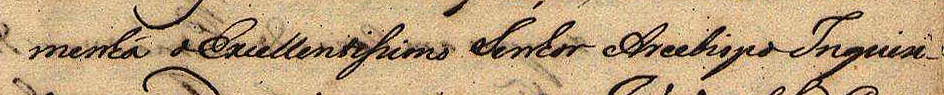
menhã o Excellentissimo Senhor Arcebispo Inquisi
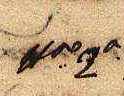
tt.a 2a.
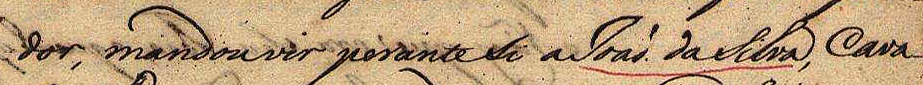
dor, mandou vir perante Si a Ioaõ da Silva, Cava
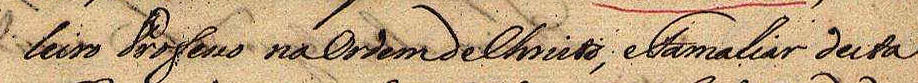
leiro Professo na Ordem de Christo, e Famaliar desta
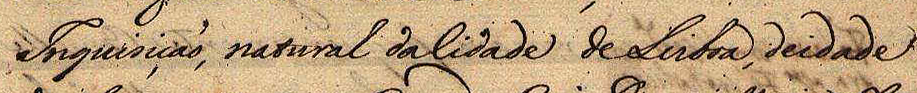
Inquisiçaõ, natural da Cidade de Lisboa, de idade
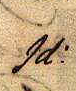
Id:
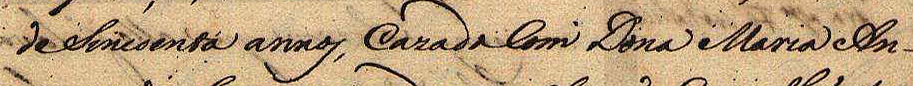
de Sincoenta annos, Cazado Com Dona Maria An
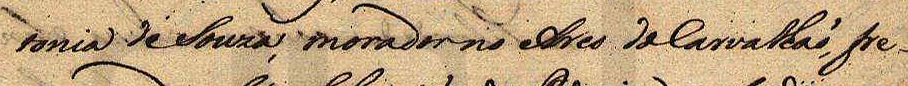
tonia de Souza, morador no Arco do Carvalhaõ, fre
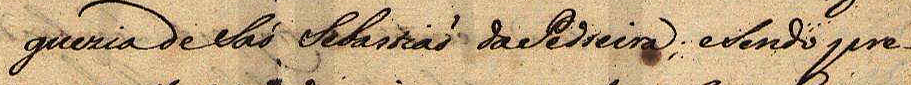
guezia de Saõ Sebastiaõ da Pedreira; e sendo pre
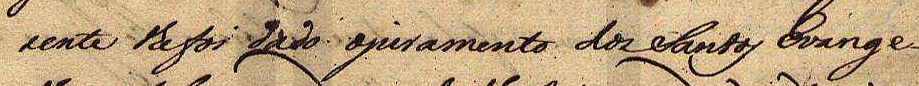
sente lhe foi dado o juramento dos Santos Evange
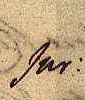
Iur:
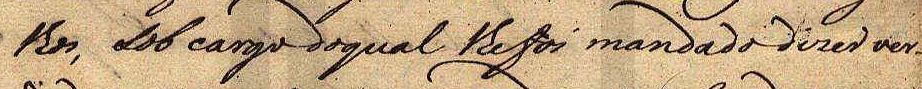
lhos, sob cargo do qual lhe foi mandado dizer ver
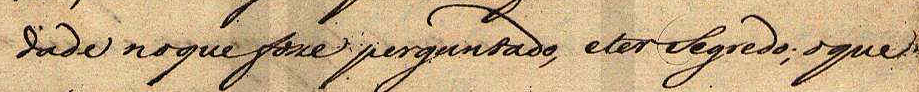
dade no que fosse perguntado, e ter Segredo; o que
